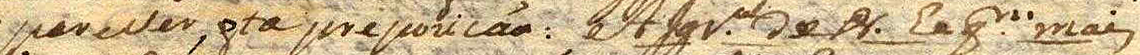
pareser, esta prepozicaõ: A Jgr.a de Ds̄. he q̄ mais
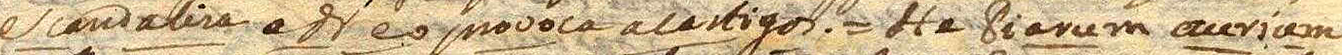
scandaliza a Ds̄. e o provoca a castigos. = He Piarum aurium
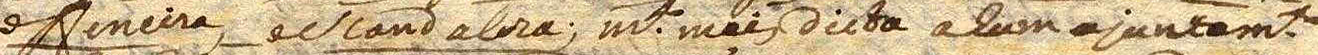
offenciza, e scandaloza; m.to mais dicta a hum ajuntam.to
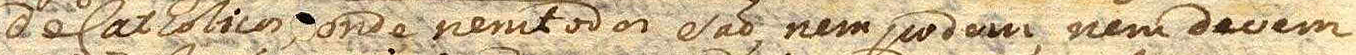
de Catholicos, onde nem todos saõ, nem podem, nem devem
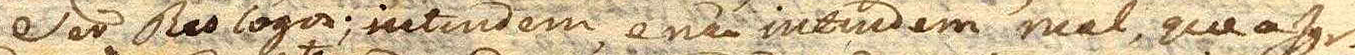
ser Theologos; intendem, e não intendem mal, que a Jgr.a
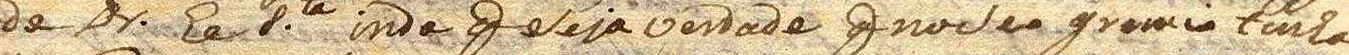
de Ds̄. he s.ta inda q̄ seja verdade q̄ no seo gremio tenha
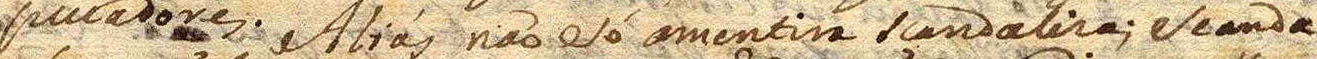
peccadores; Aliás não só a mentira scandaliza; scanda
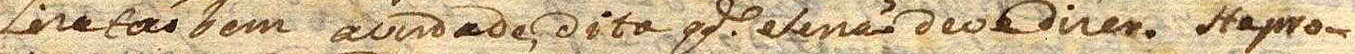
liza taõ bem a verdade, dita qd.o senão deve dizer. He pro
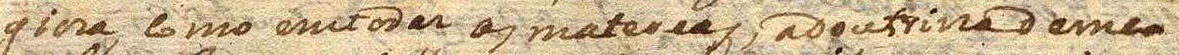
gioza como em todas as matereas a Doutrina de meo
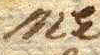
N_
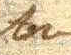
An
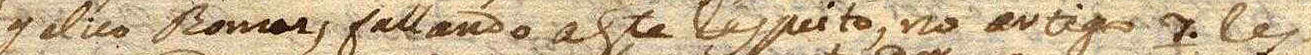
gelico thomaz, fallando a este Respeito, no artigo 7. Res
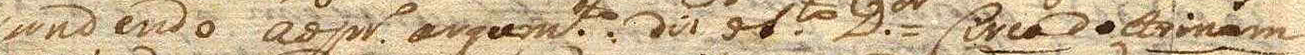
pundendo ao pr.o argum.to dis o S.to D.or = Crea doctrinam
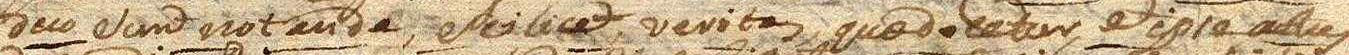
duo sunt notanda, scilicet, veritas quae docetur, et ipse actus
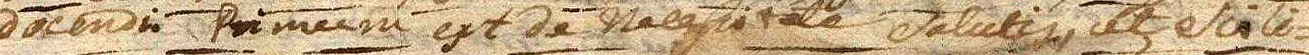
docendi. Primum est de Necessitate salutis, ut scili
